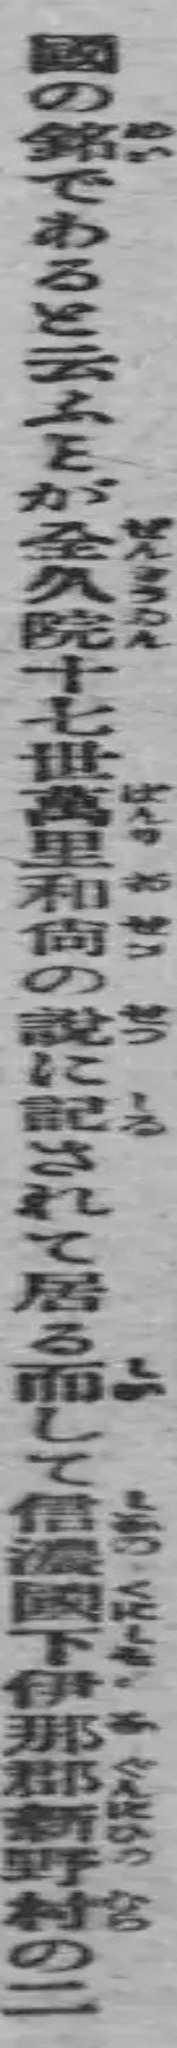国の銘であると云ふことが全久院十七世万里和尚の説に記されて居る而して信濃国下伊那郡新野村の二
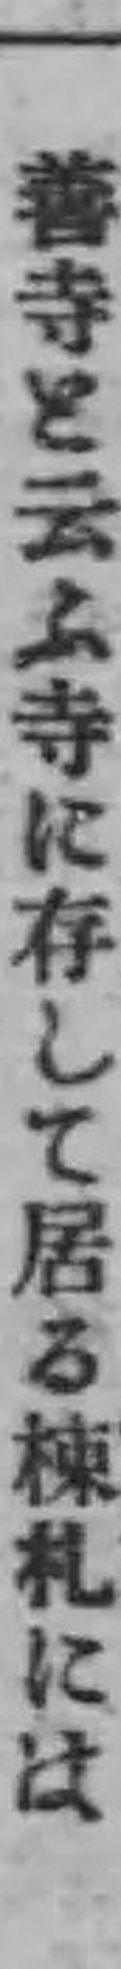善寺と云ふ寺に存して居る棟札には
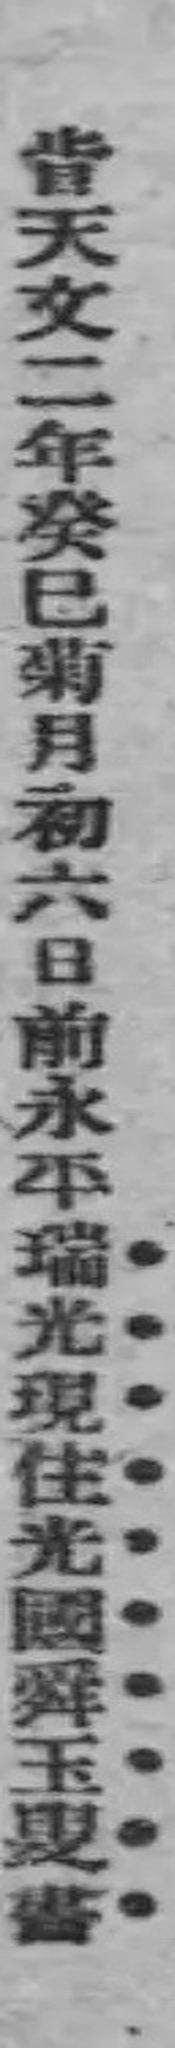肯天文二年癸巳菊月初六日前永平瑞光現住光国舜玉叟書
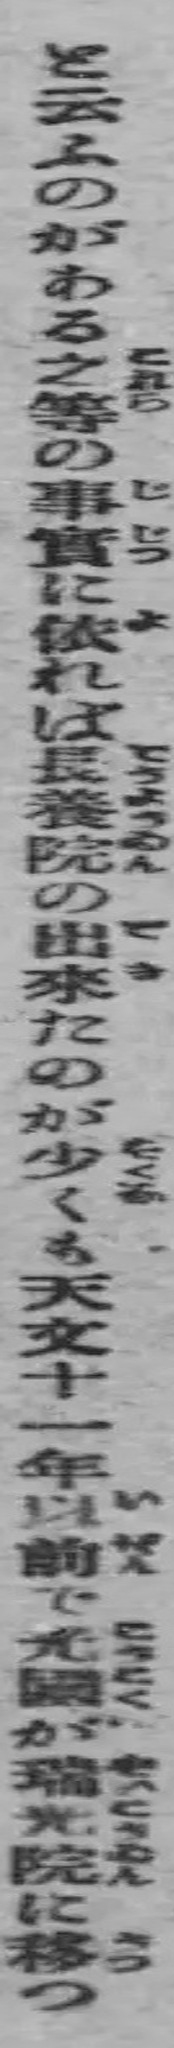と云ふのがある之等の事実に依れば長養院の出来たのが少くも天文十一年以前で光国が瑞光院に移つ
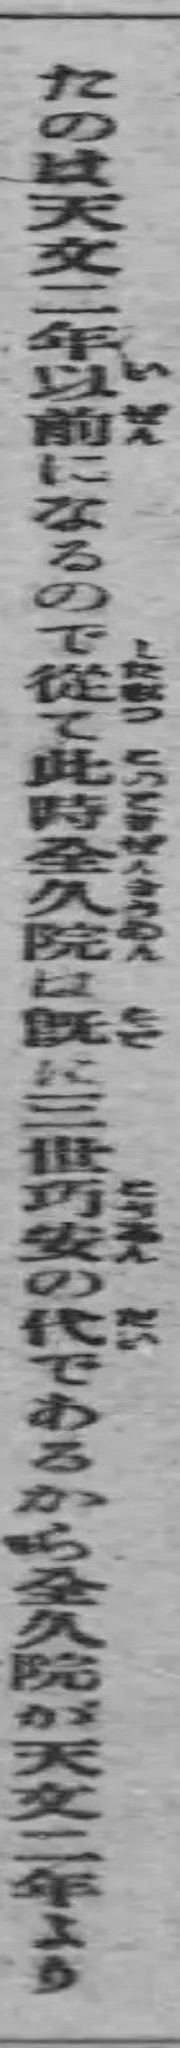たのは天文二年以前になるので従て此時全久院は既に三世巧安の代であるから全久院が天文二年より
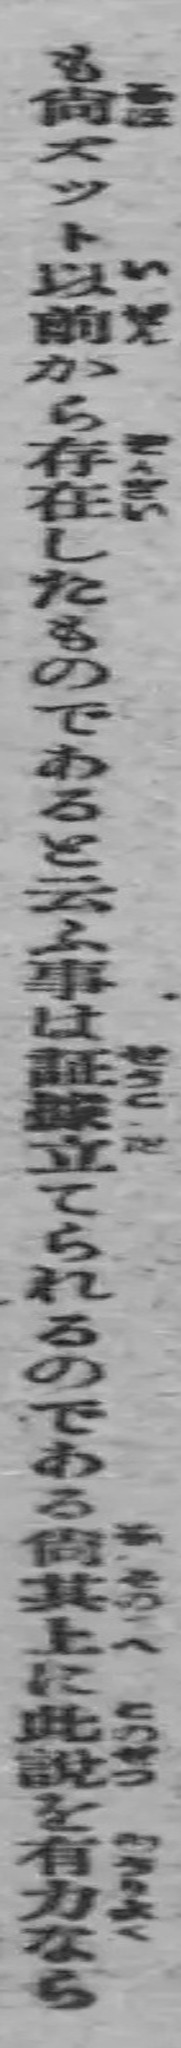も尚ズツト以前から存在したものであると云ふ事は証拠立てられるのである尚其上に此説を有力なら
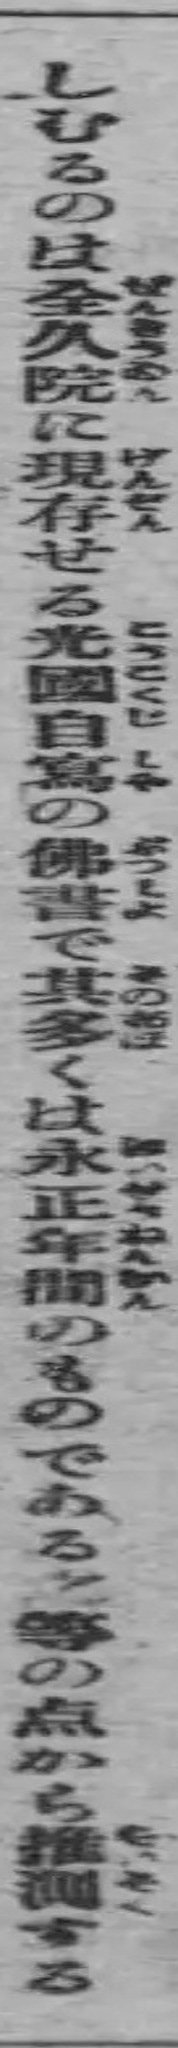しむるのは全久院に現存せる光国自写の仏書で其多くは永正年間のものである之等の点から推測する
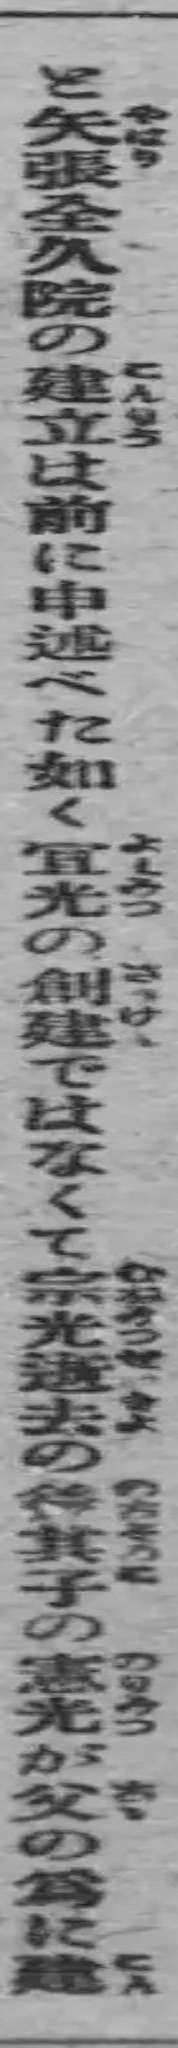と矢張全久院の建立は前に申述べた如く冝光の創建ではなくて宗光逝去の後其子の憲光が父の為に建
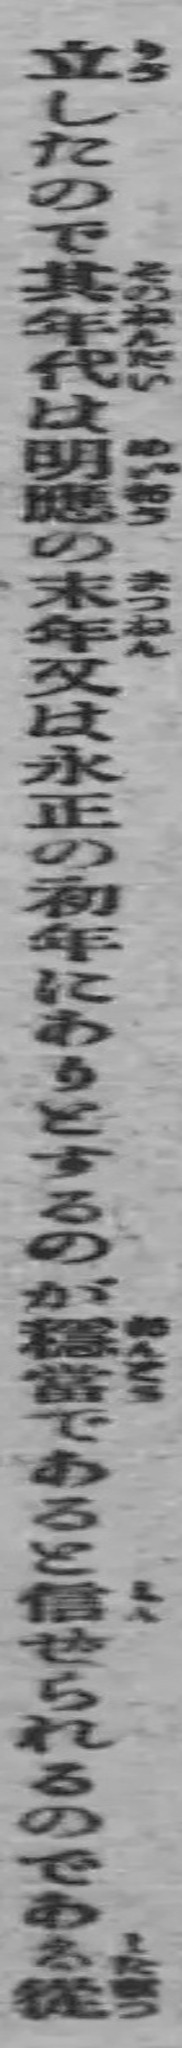立したので其年代は明応の末年又は永正の初年にありとするのが穏当であると信ぜられるのである従
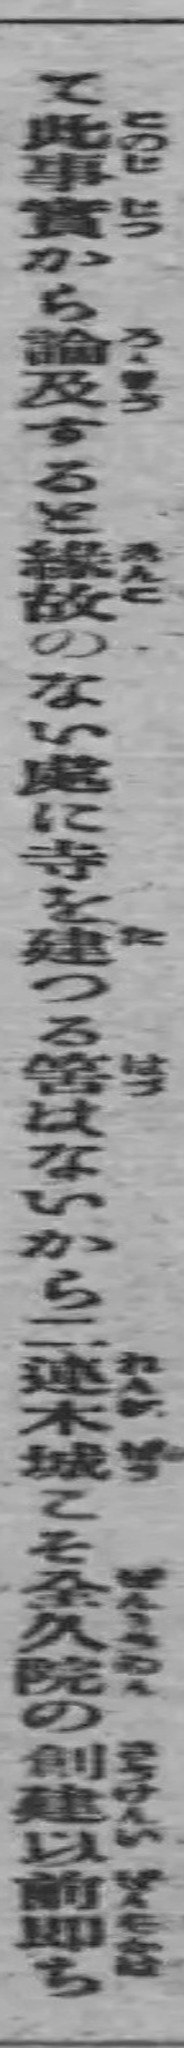て此事実から論及する縁故のない処に寺を建つる筈はないから二連木城こそ全久院の創建以前即ち
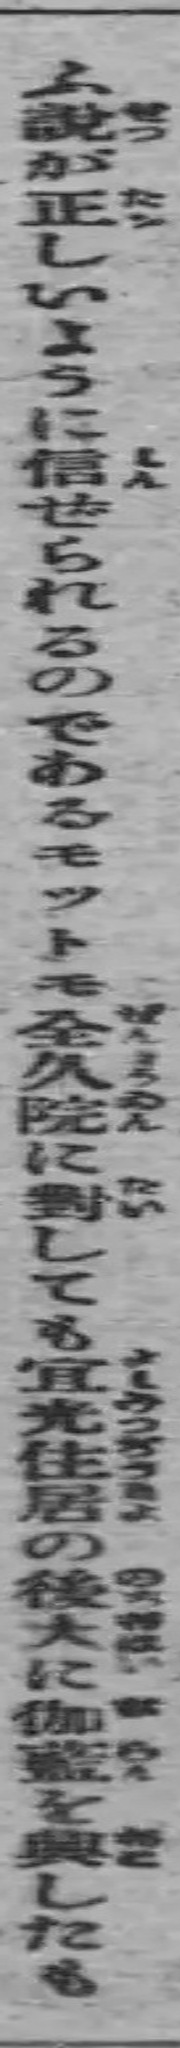関係ふ説が正しいように信ぜられるのであるモツトモ全久院に対しても冝光住居の後大に伽藍を興したも
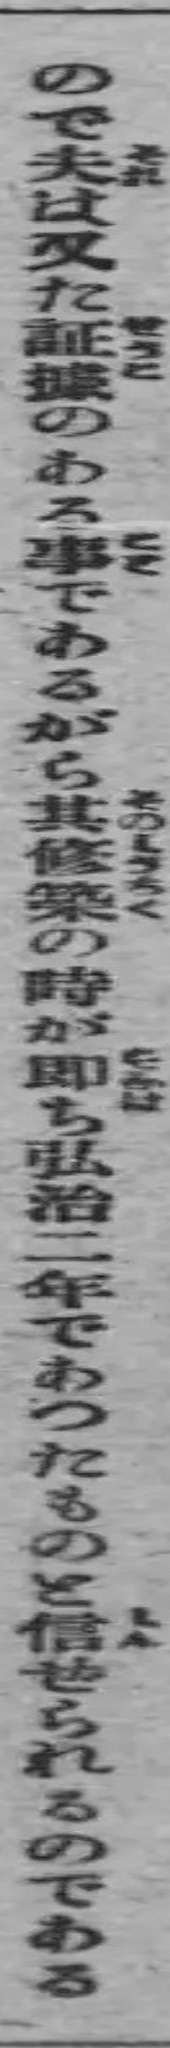ので夫は又た証拠のある事であるがら其修築の時が即ち弘治二年であつたものと信ぜられるのである
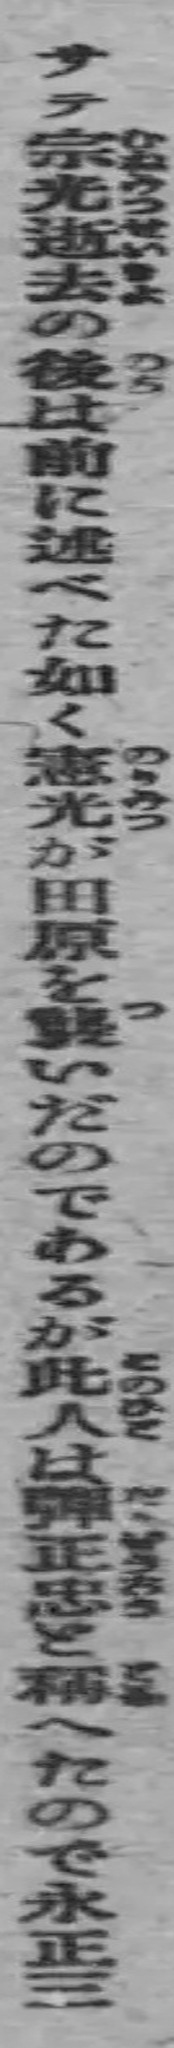サテ宗光逝去の後は前に述べた如く憲光が田原を襲いだのであるが此人は弾正忠と称へたので永正三
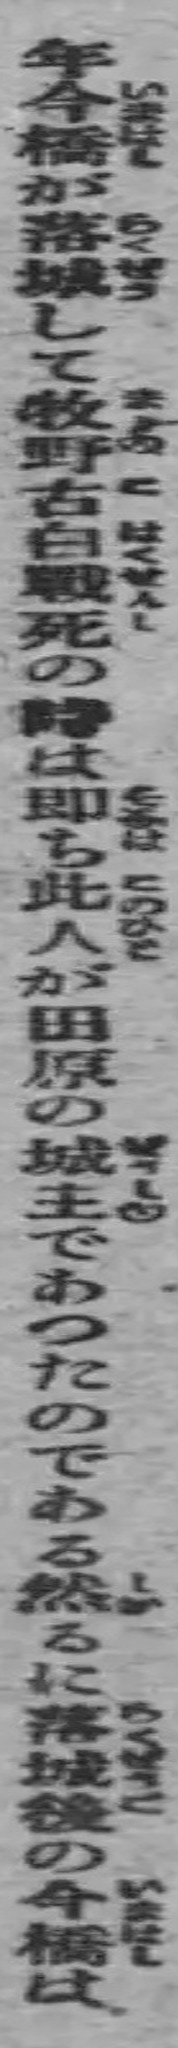年今橋が落城して牧野古白戦死の時は即ち此人が田原の城主であつたのである然るに落城後の今橋は
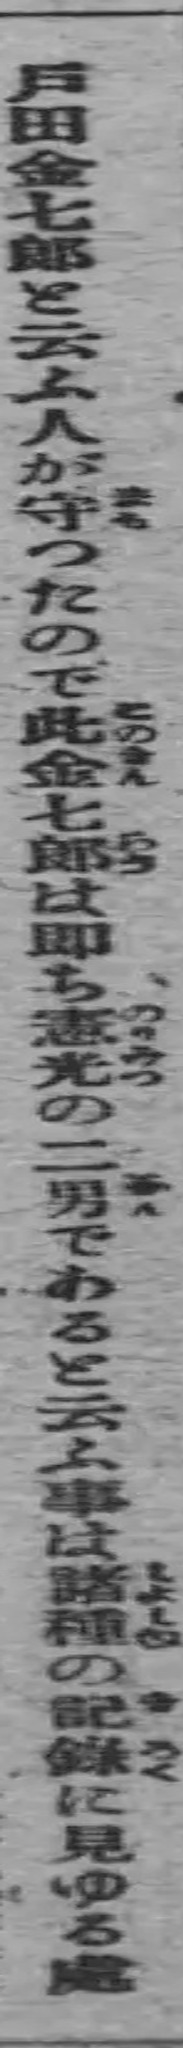戸田金七郎と云ふ人が守つたので此金七郎は即ち憲光の二男であると云ふ事は諸種の記録に見ゆる処
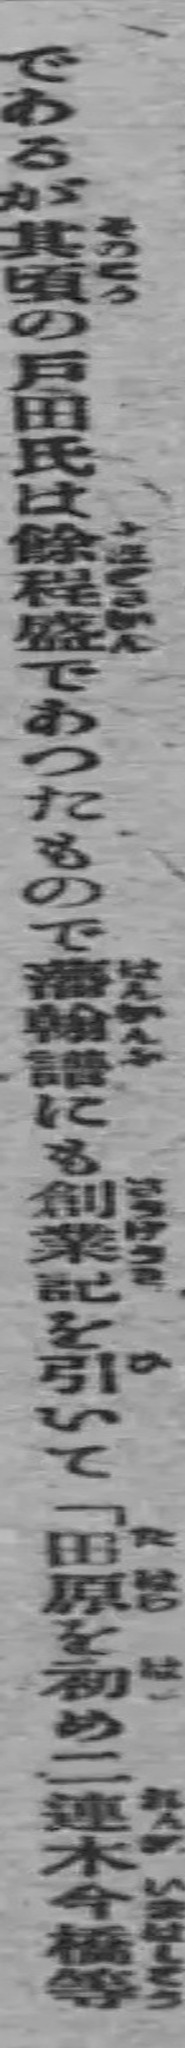戸田憲光であるが其頃の戸田氏は余程盛であつたもので藩翰譜にも創業記を引いて「田原を初め二連木今橋等
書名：豊橋市史談
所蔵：国立国会図書館 National Diet Library, JAPAN
